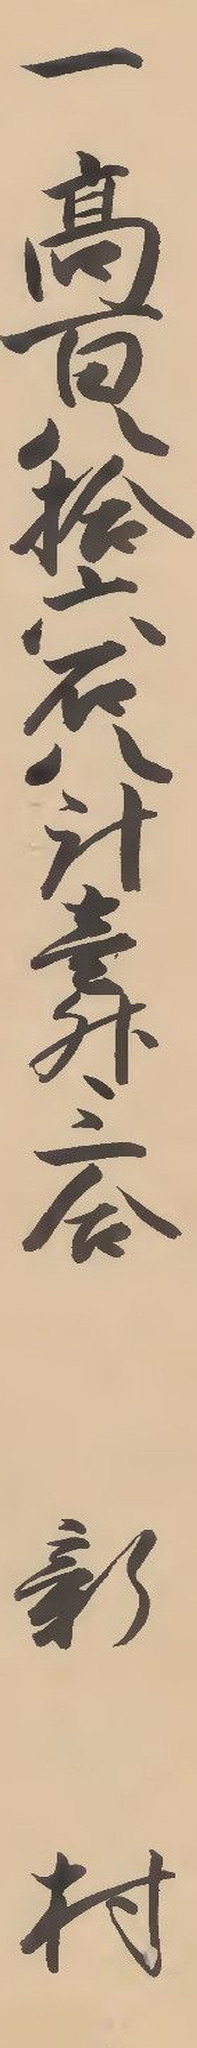一高百八拾六石八斗壱升三合新村
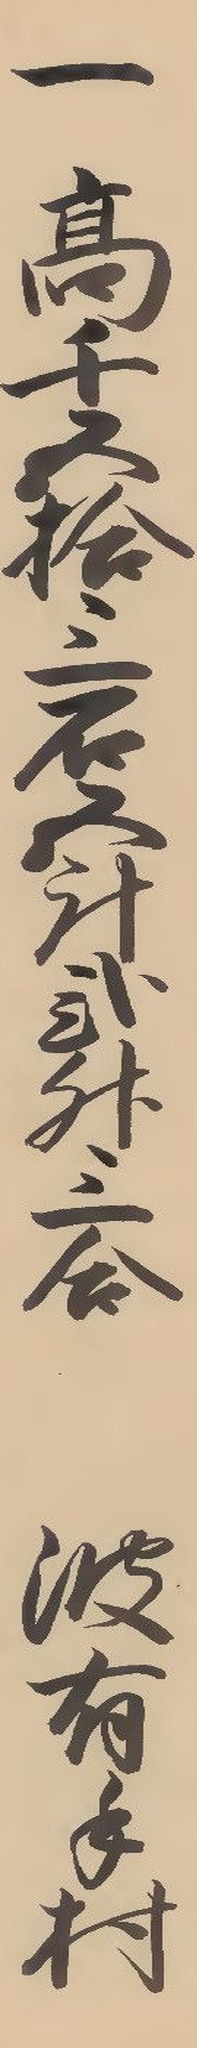一高千五拾三石五斗弐升三合波有手村
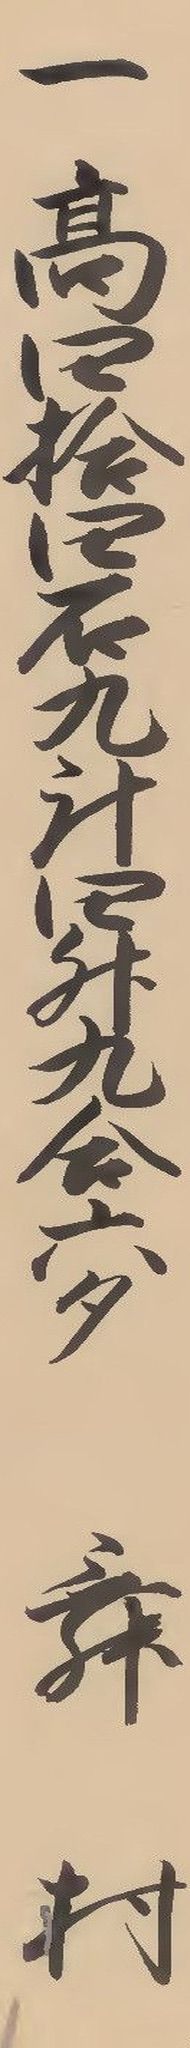一高四拾四石九斗四升九合六勺舞村
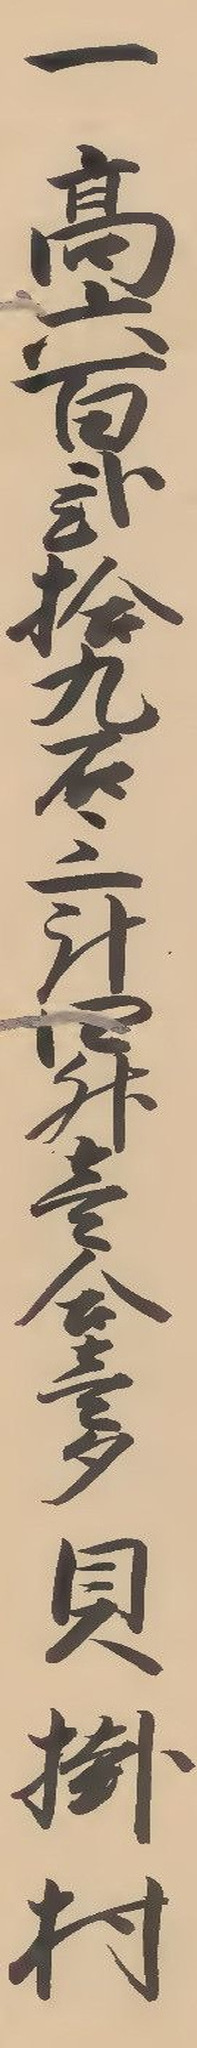一高六百弐拾九石三斗四升壱合壱勺貝掛村

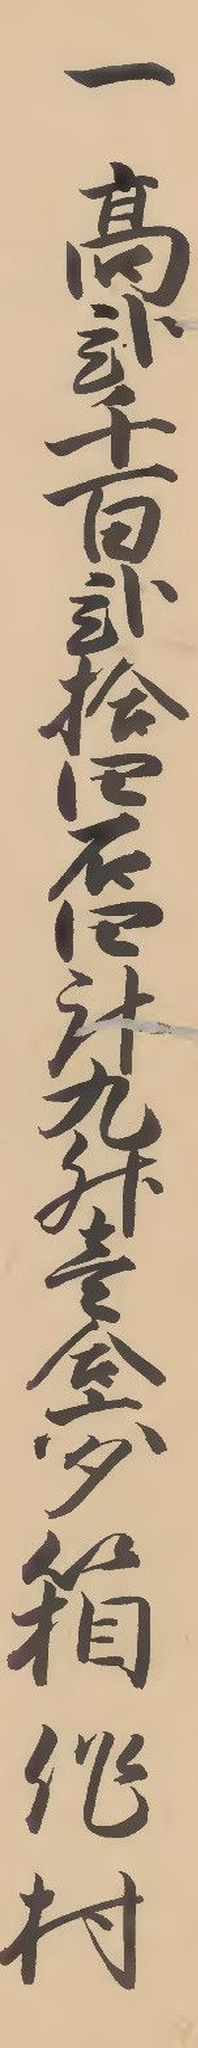一高弐千百弐拾四石四斗九升壱合六勺箱作村
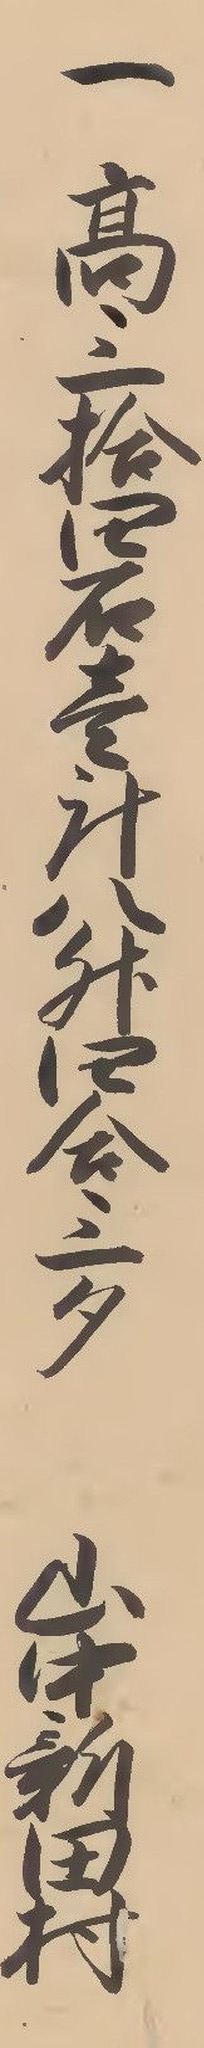一高三拾四石壱斗八升四合三勺山中新田村
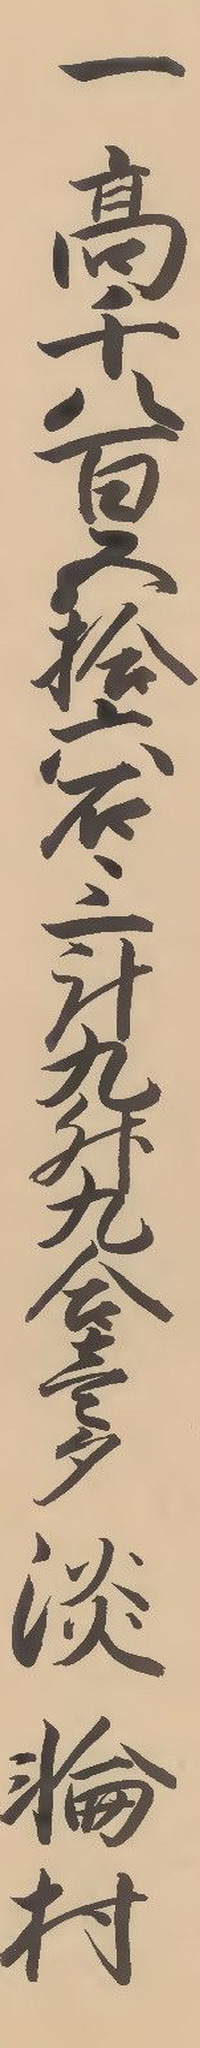一高千八百五拾六石三斗九升九合壱勺淡輪村
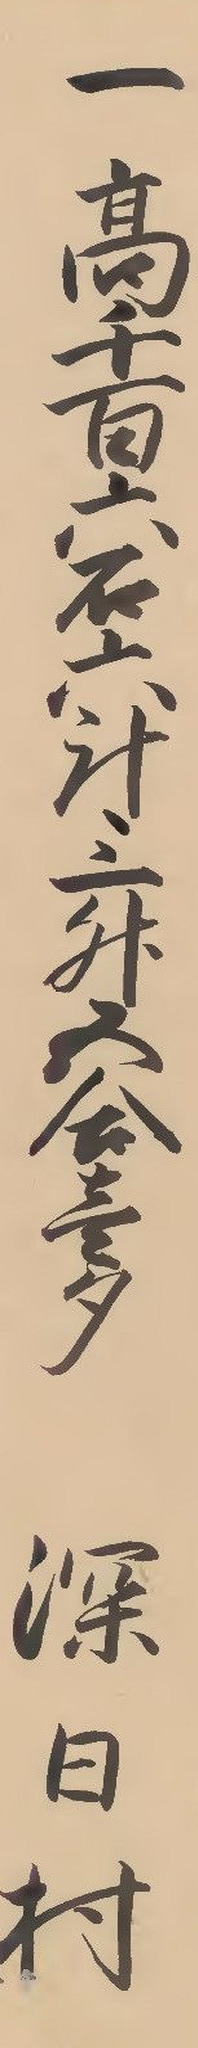一高千百六石六斗三升五合壱勺深日村
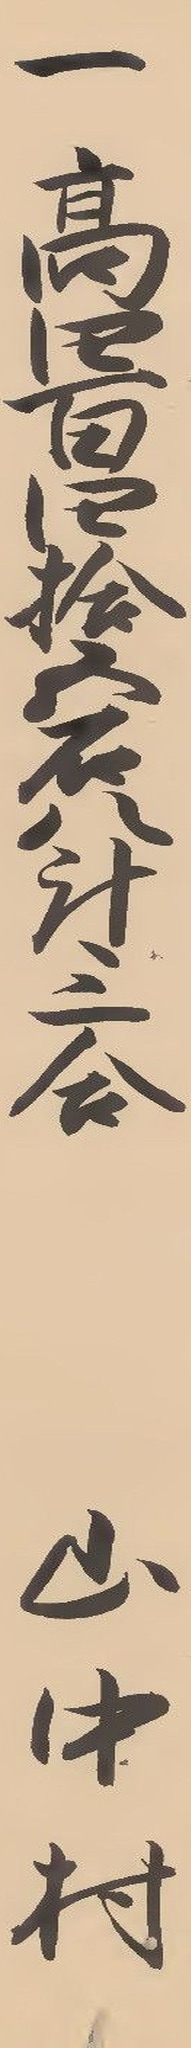一高四百四拾五石八斗三合山中村
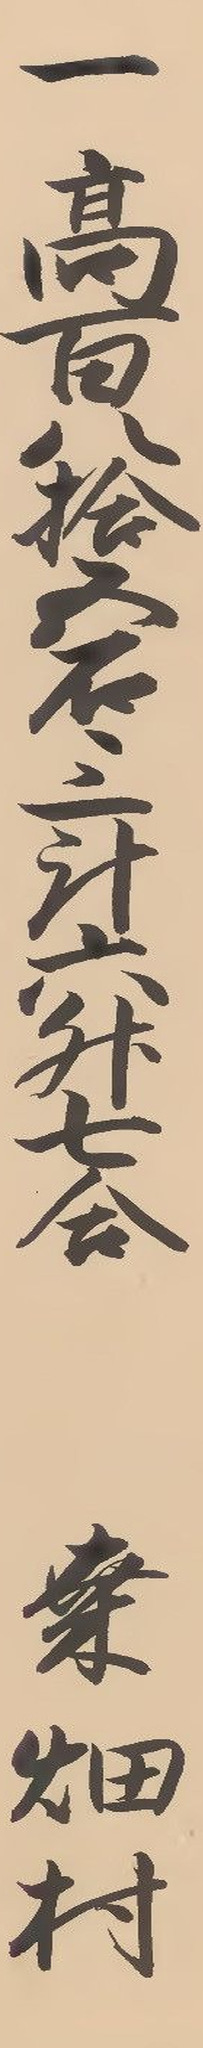一高百八拾五石三斗六升七合桑畑村
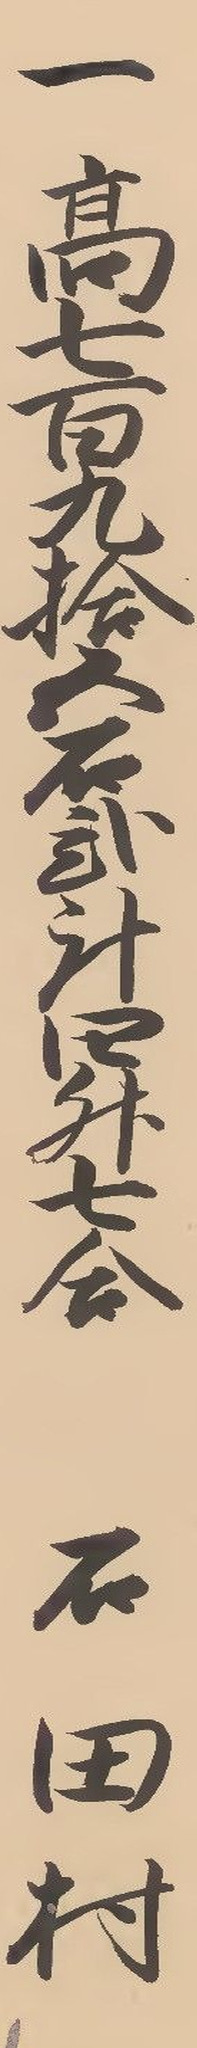一高七百九拾五石弐斗四升七合石田村
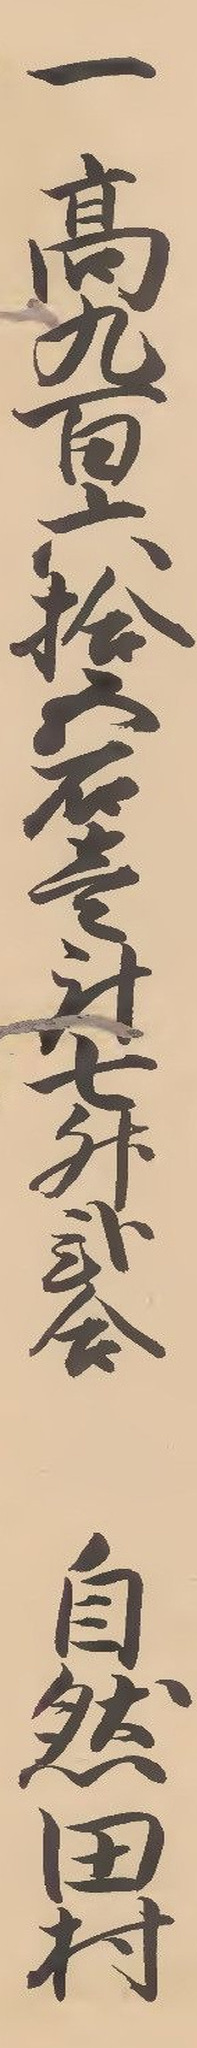一高九百六拾五石壱斗七升弐合自然田村

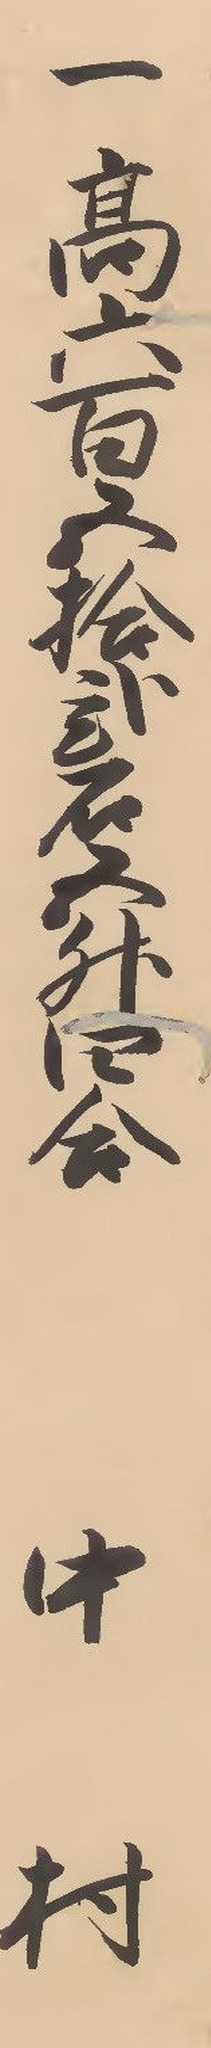一高六百五拾弐石五升四合中村
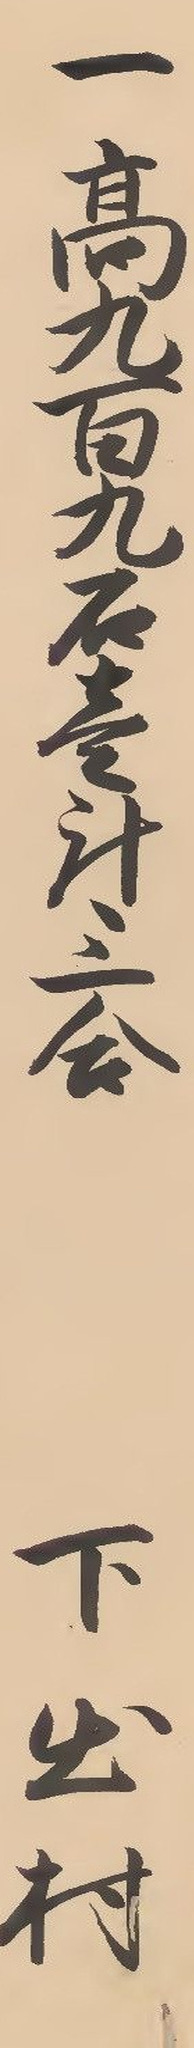一高九百九石壱斗三合下出村
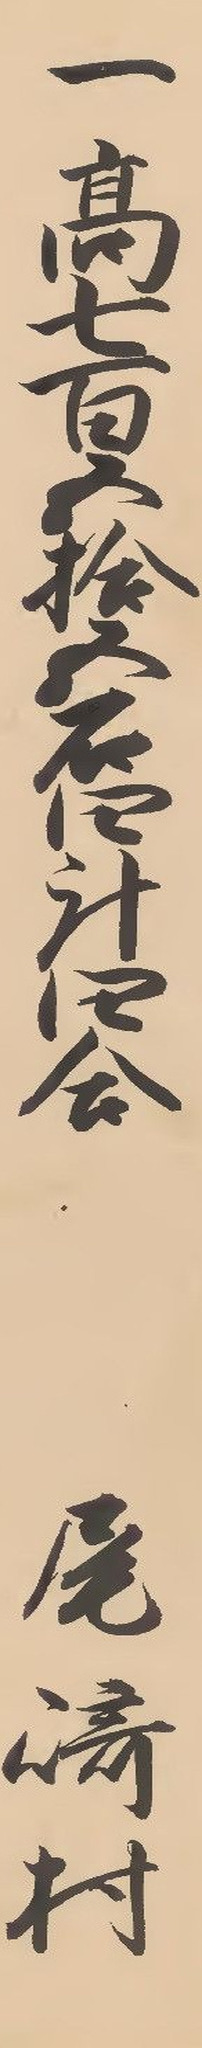一高七百五拾五石四斗四合尾崎村
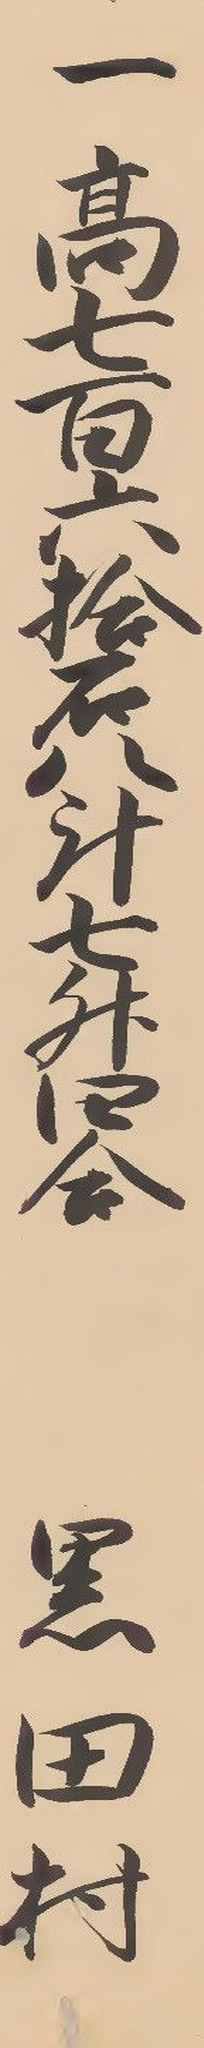一高七百六拾石八斗七升四合黒田村
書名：和泉国郷帳
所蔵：国立公文書館 National Archives of Japan
